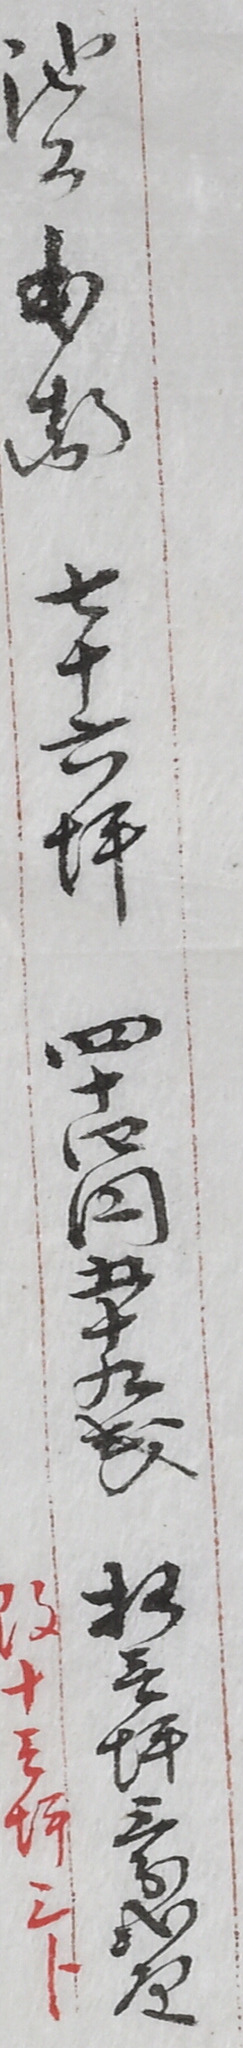池上本衛七十六坪四十四円五十九銭拾壱坪三分弐厘

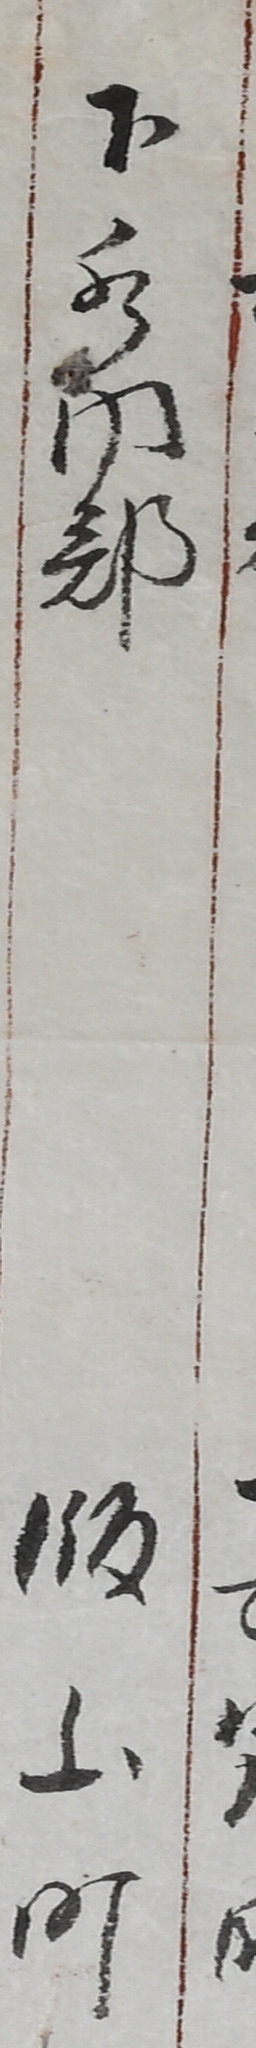下水内郡飯山町
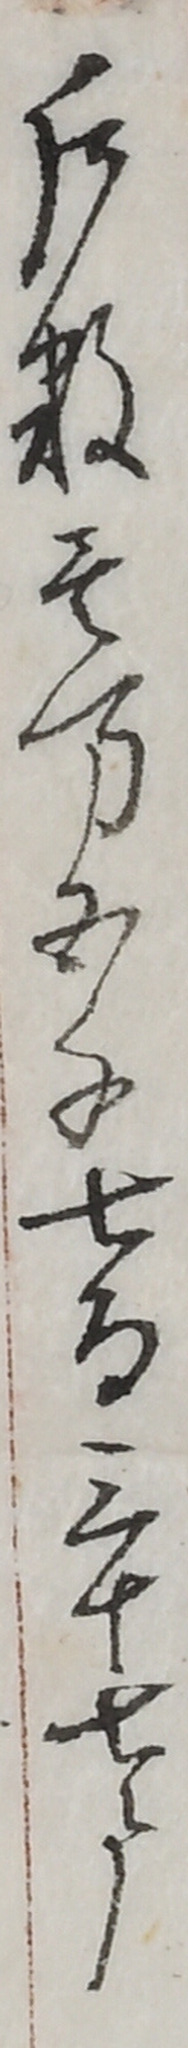戸数壱万五千七百三十七戸
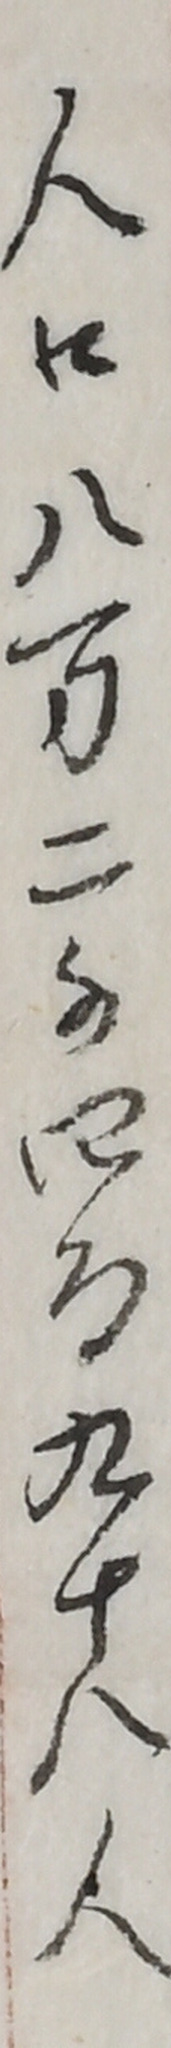人口八万二千四百九十八人
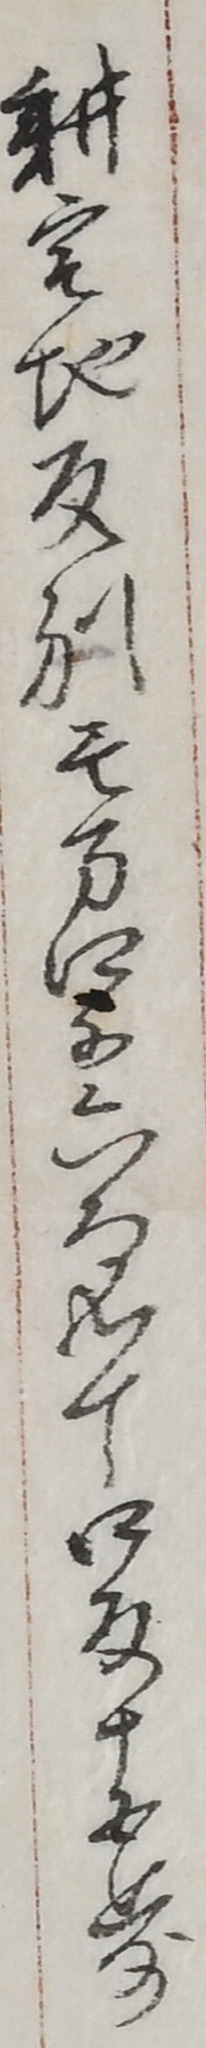耕宅地反別壱万四千六百弐十四反十五歩
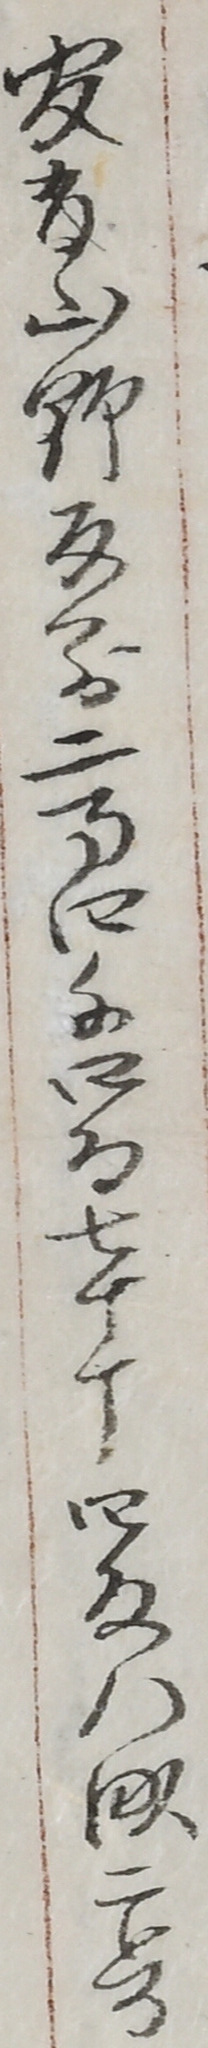官有山野反別二万四千四百七十丁四反八畝二歩
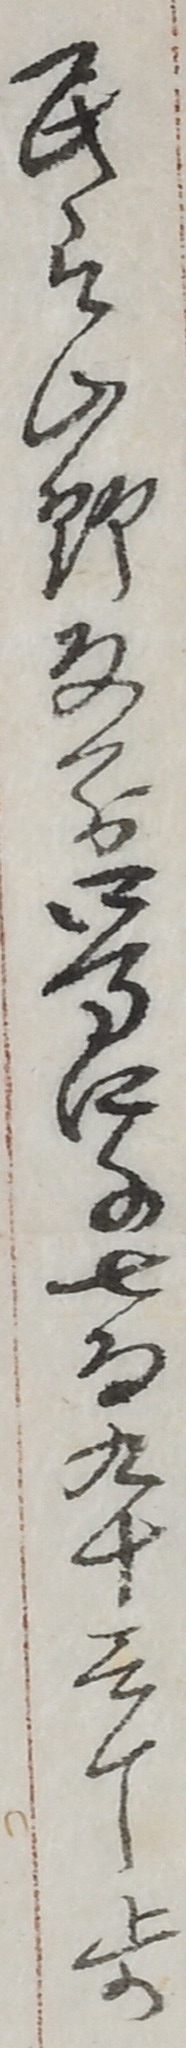民有山野反別四万四千七百九十壱丁歩

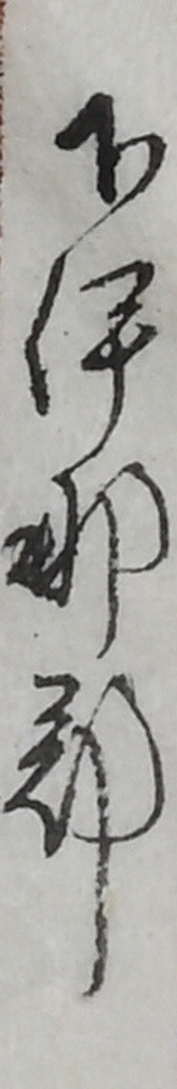下伊那郡
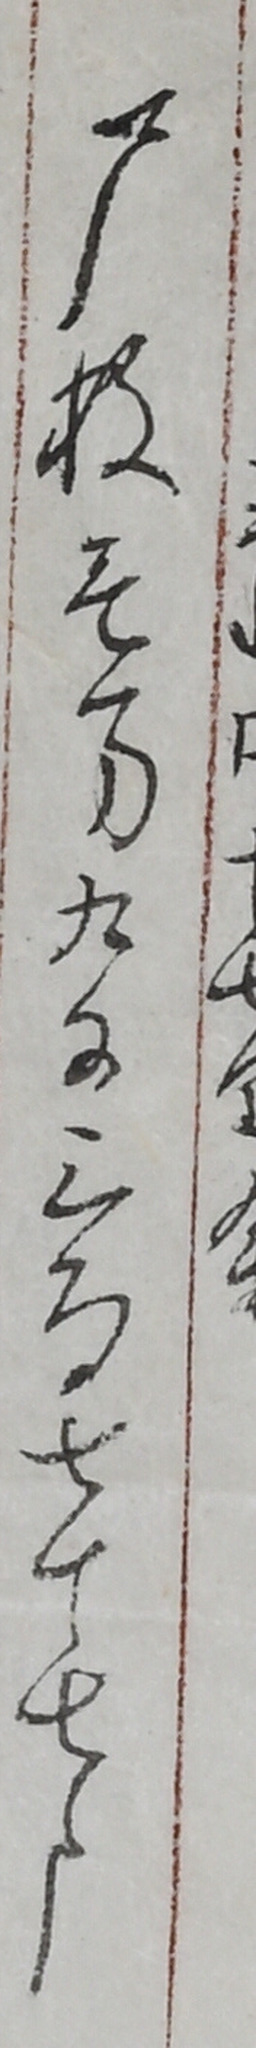戸数壱万九千三百七十七戸
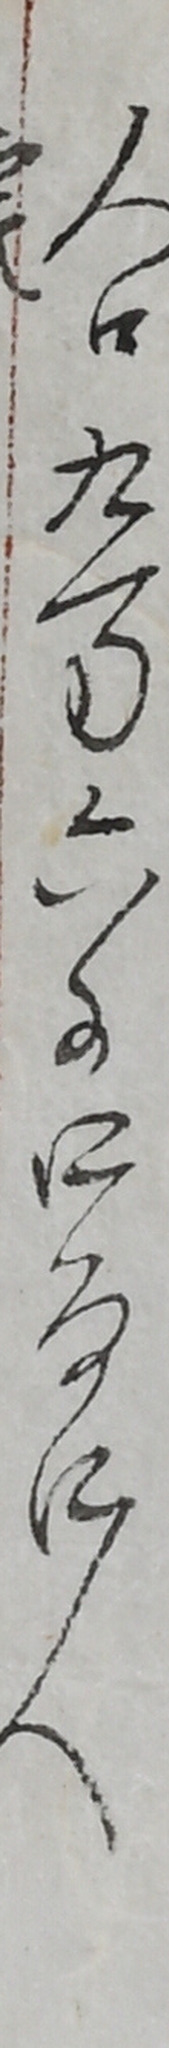人口九万六千四百四人
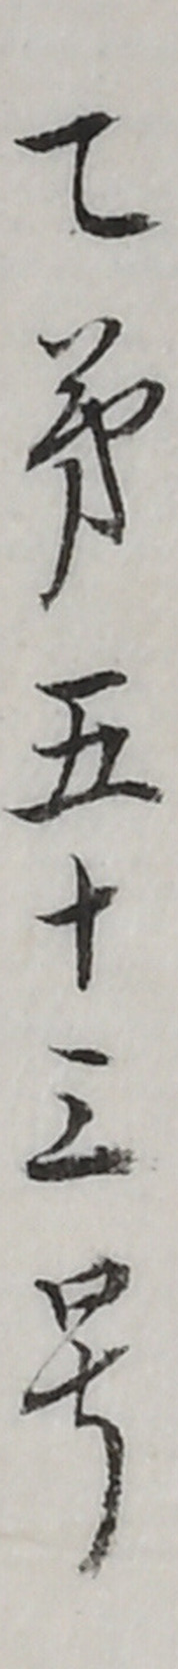乙第五十三号
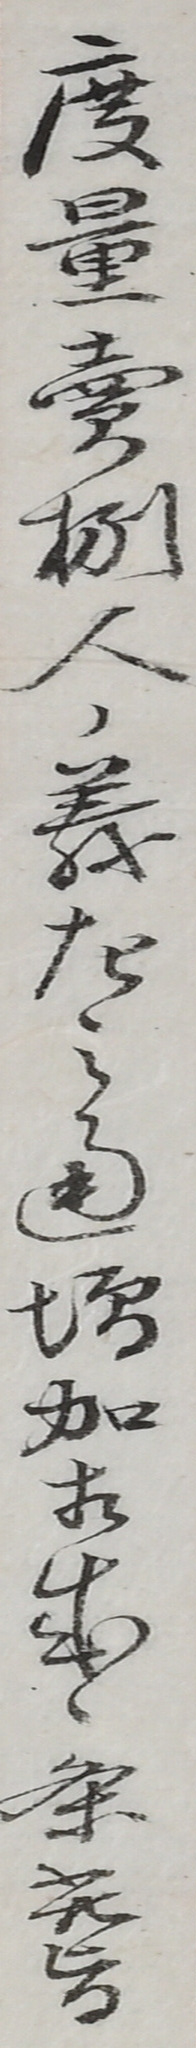度量売捌人ノ義左之通増加相成候条此旨
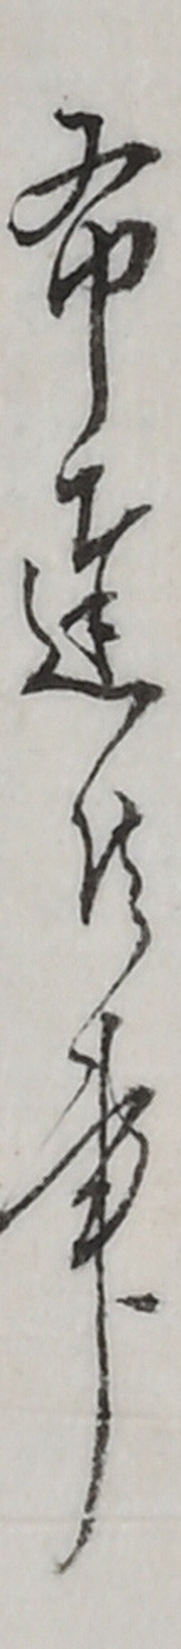布達候事
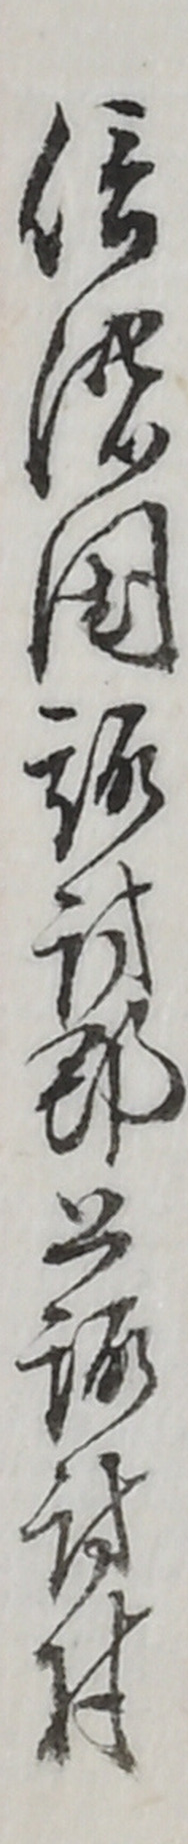信濃国諏訪郡上諏訪村
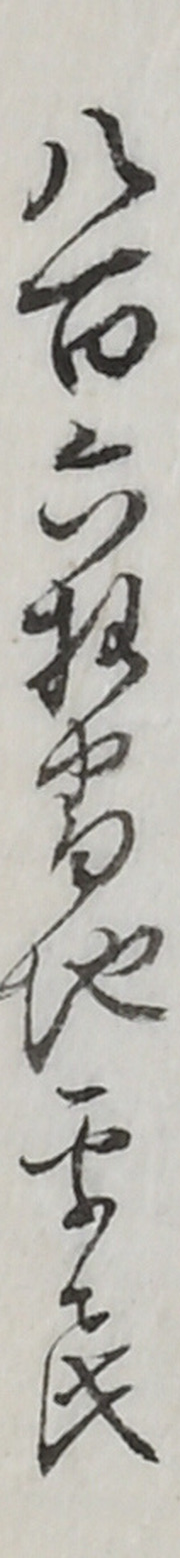八百六拾番地平民
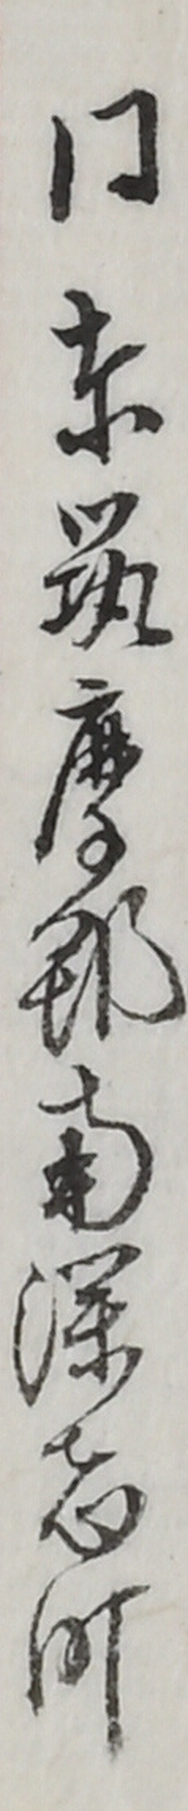同東筑摩郡南深志町
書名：郡役所勤務中御用抜書
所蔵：伊那市立高遠町図書館・合同会社AMANE
